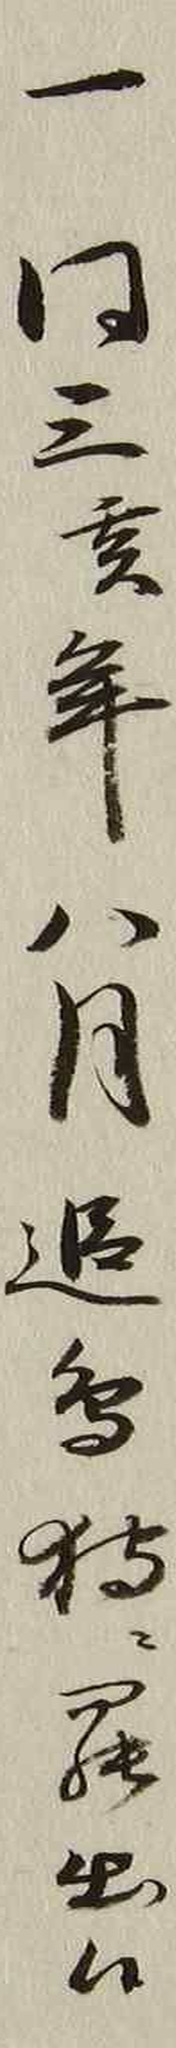一同三亥年八月追鳥狩ニ罷出候
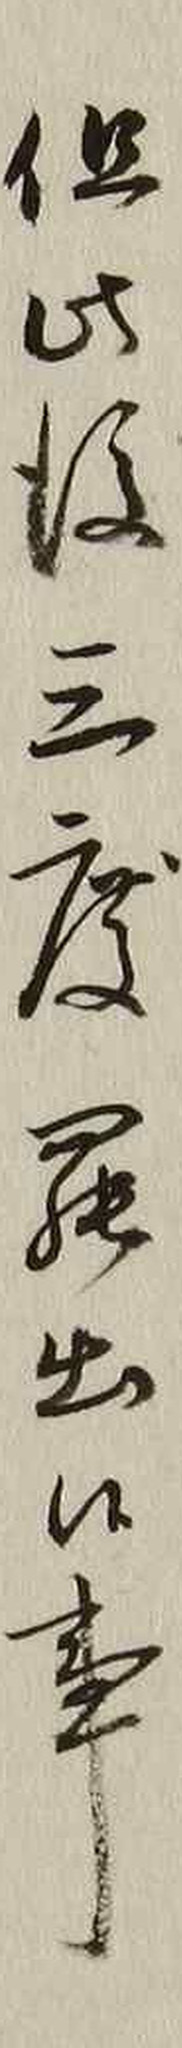但此後三度罷出候事
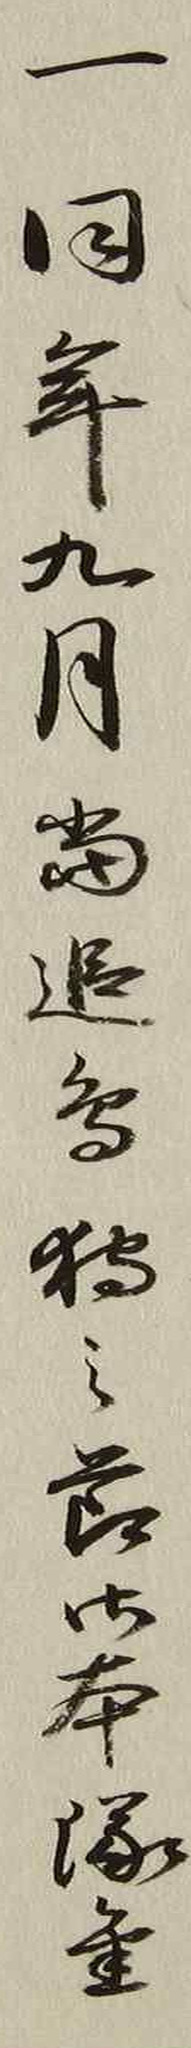一同年九月当追鳥狩之節御本隊重
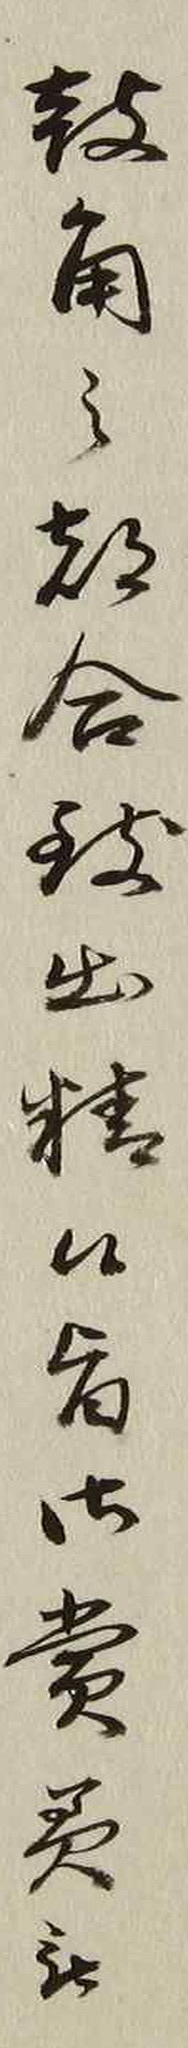鼓角之都合致出精候旨御賞美被
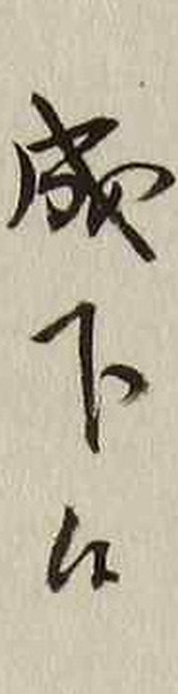成下候
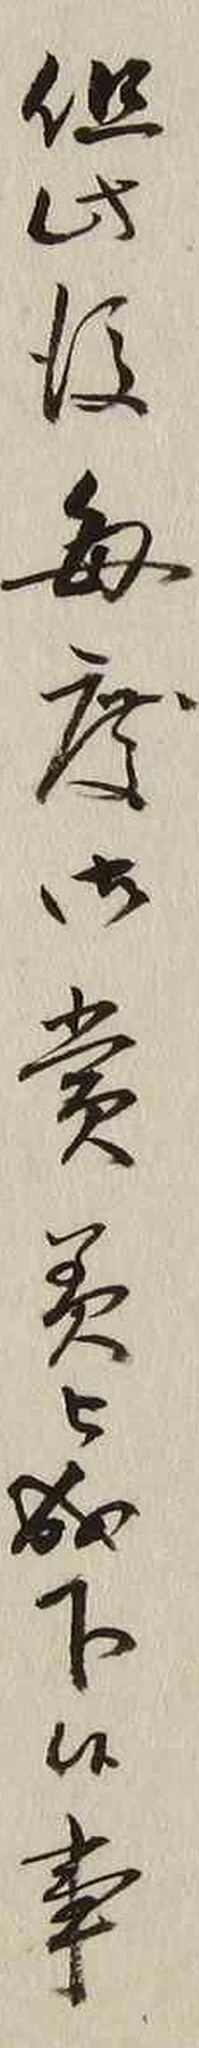但此後毎度御賞美被成下候事
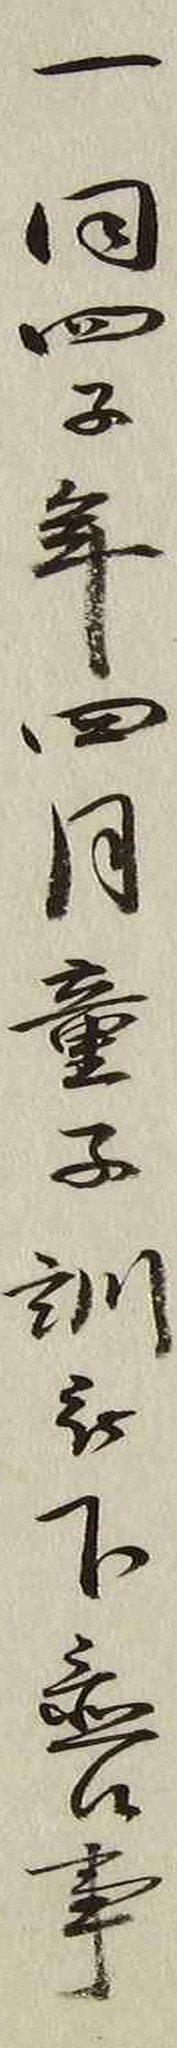一同四子年四月童子訓被下置候事
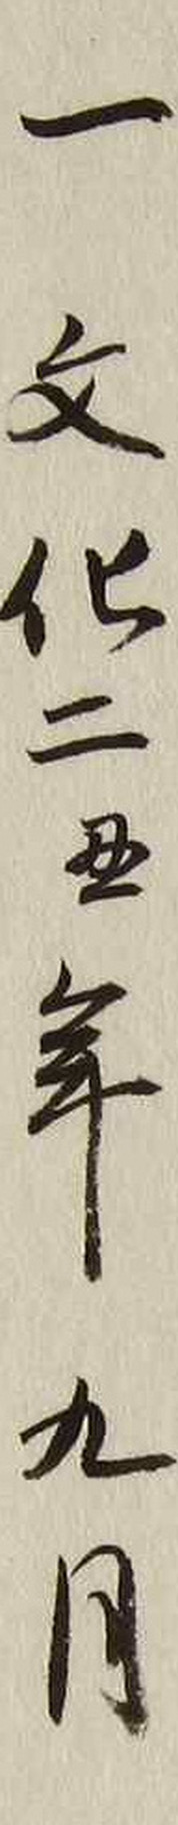一文化二丑年九月
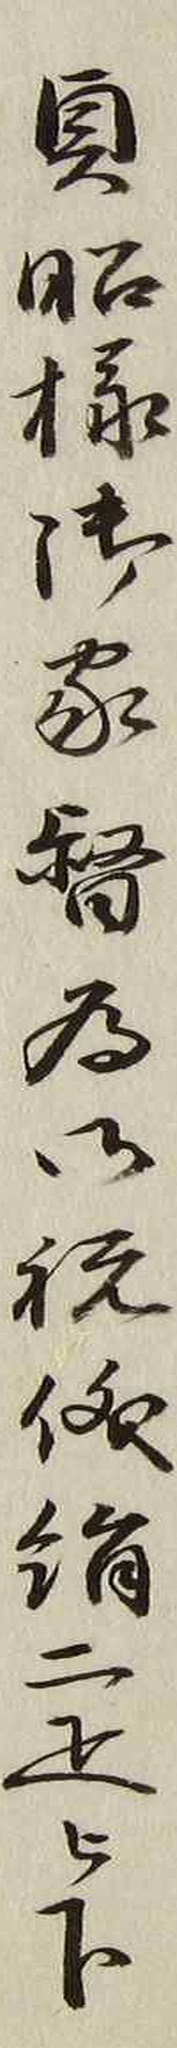貞昭様御家督為御祝儀絹二疋被下
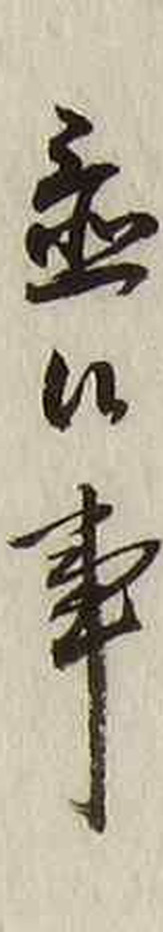置候事
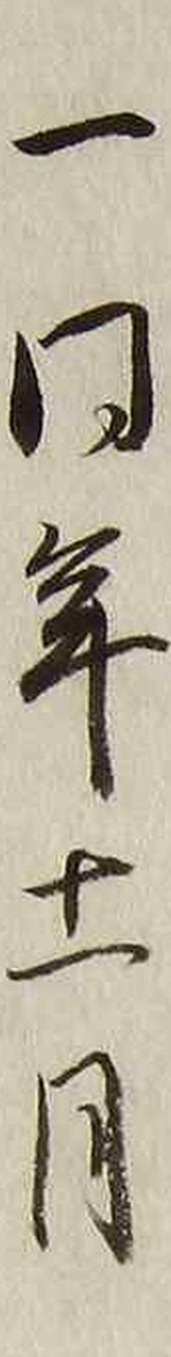一同年十一月
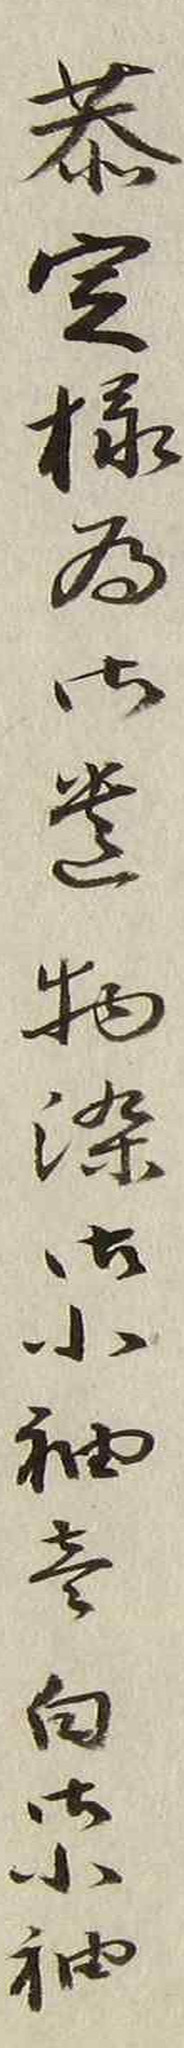恭定様為御遺物染御小袖壱白御小袖
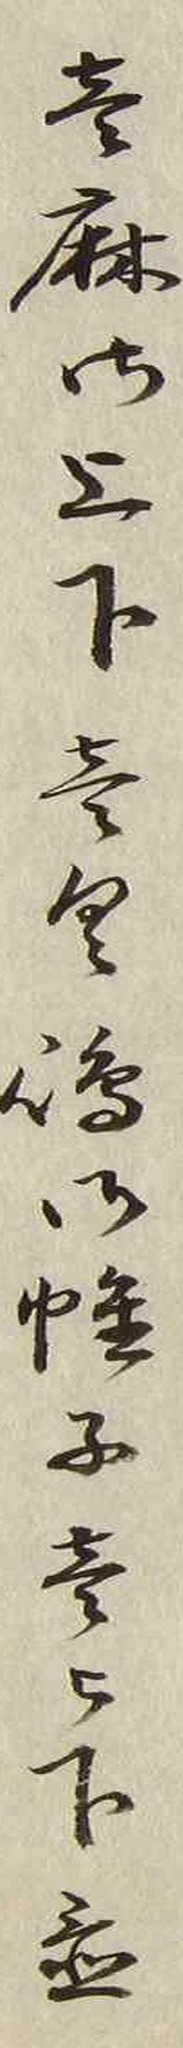壱麻御上下壱具嶋御帷子壱被下置

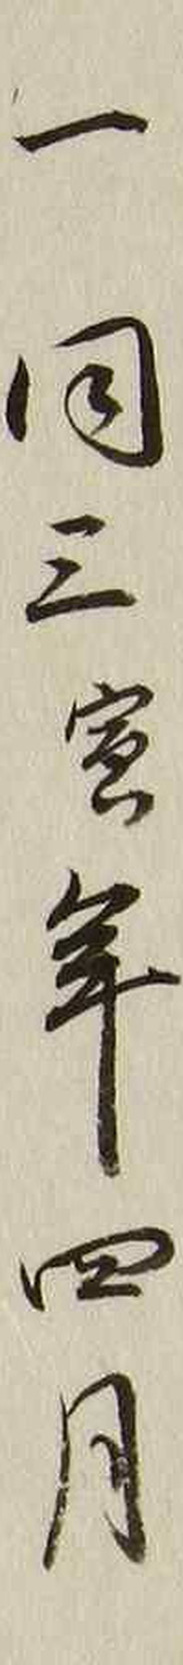一同三寅年四月
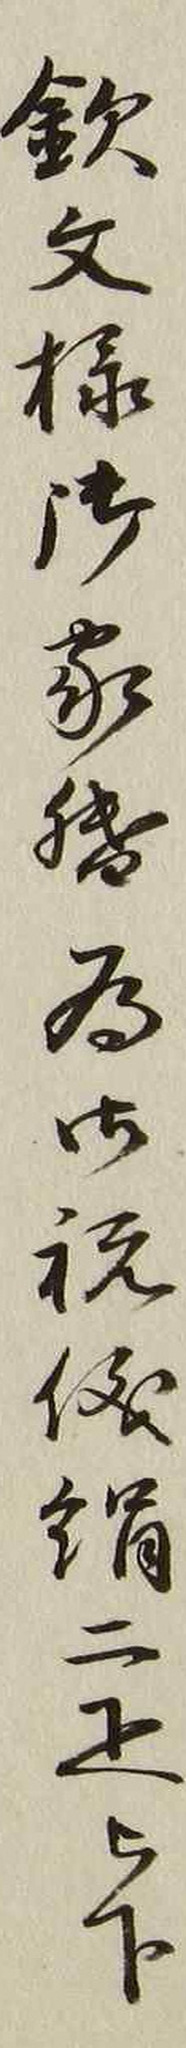欽文様御家督為御祝儀絹二疋被下
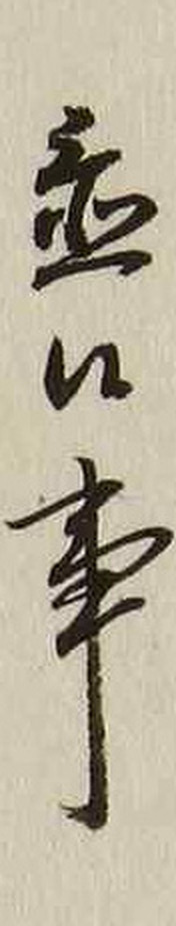置候事
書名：諸士系譜　巻之160　な之部2
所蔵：会津若松市立会津図書館
